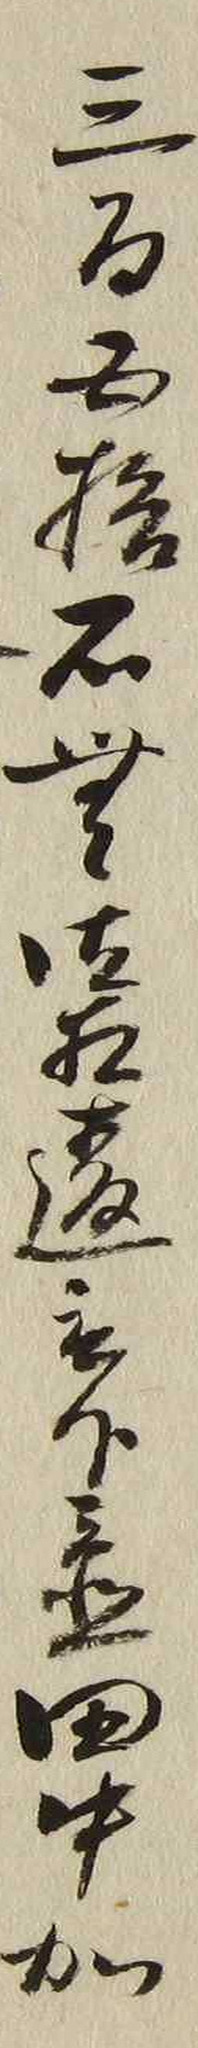三百五拾石無御相違被下置田中加
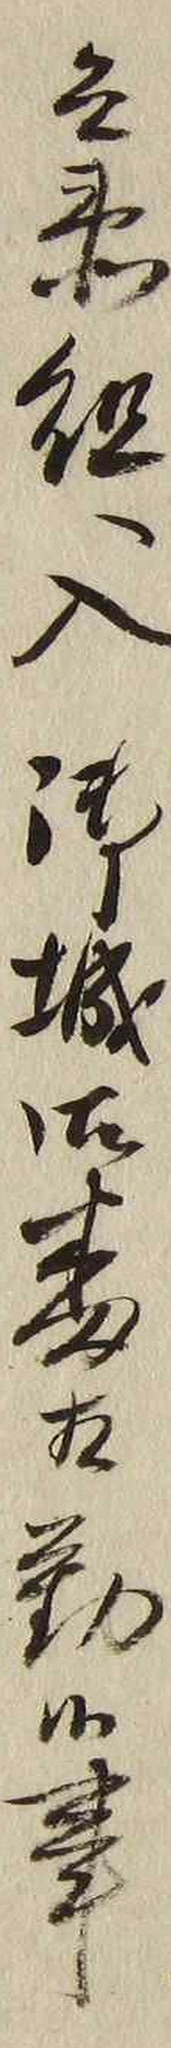兵衛組へ入御城御番相勤候事
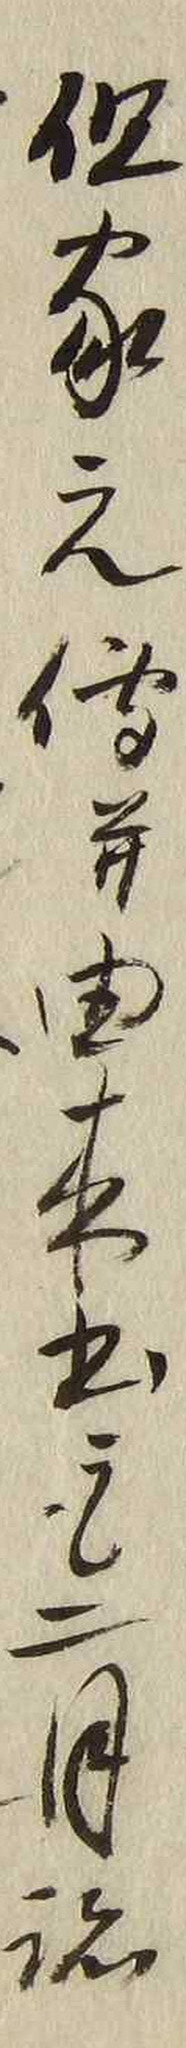但家元伝并由来書ニも二月跡
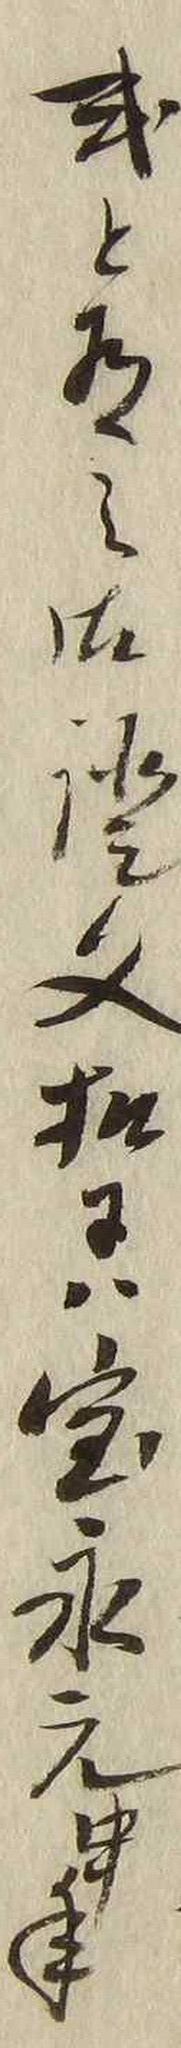式と有之御証文扣にハ宝永元申年

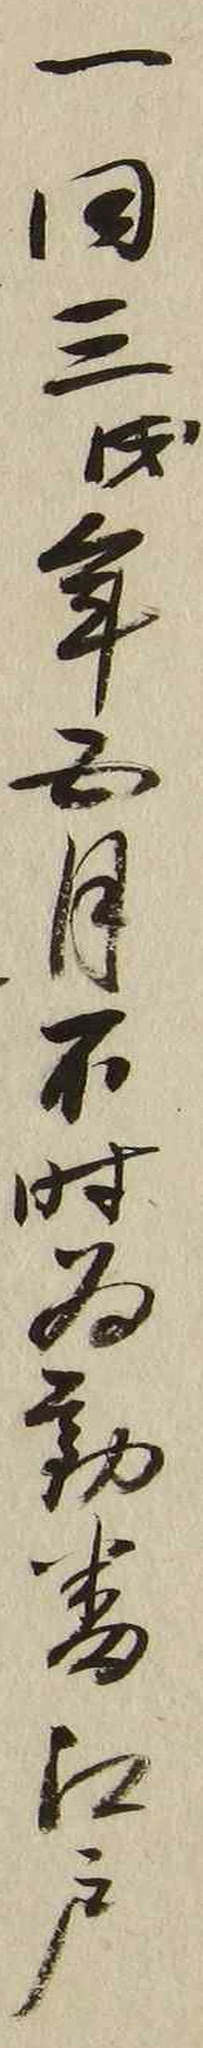一同三戌年五月不時為勤番江戸
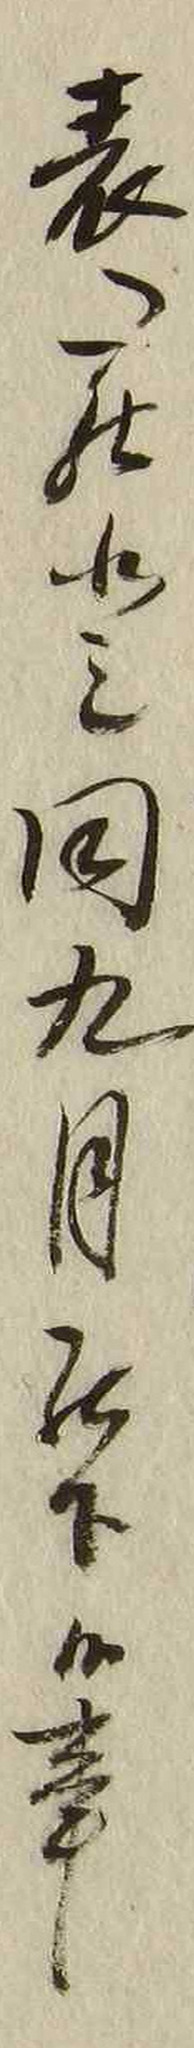表へ罷登同九月罷下候事
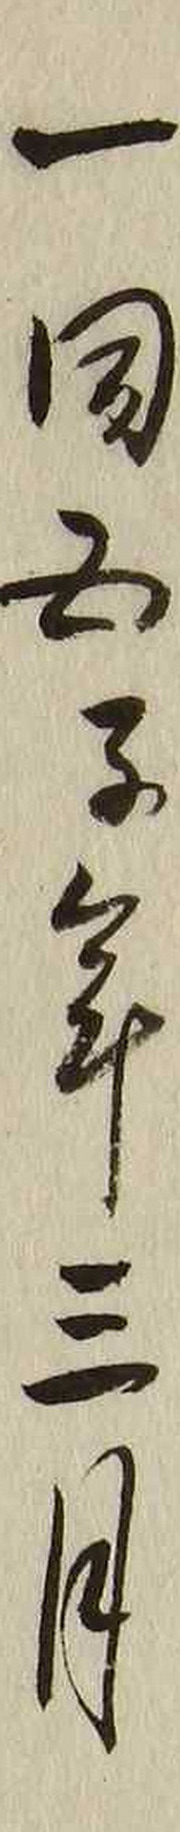一同五子年三月
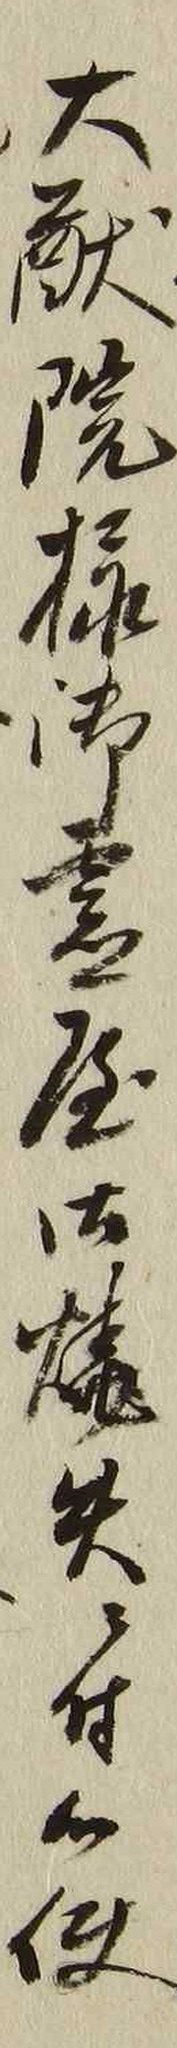大献院様御霊屋御焼失ニ付御使
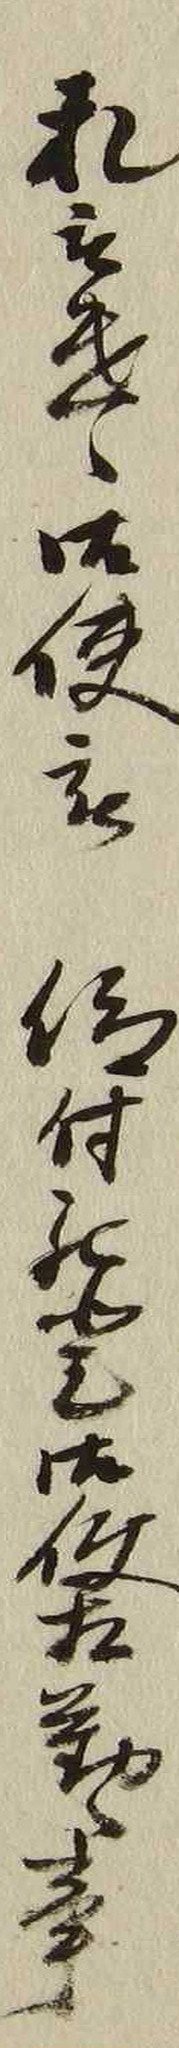札被遣候御使被仰付罷登御使相勤候事
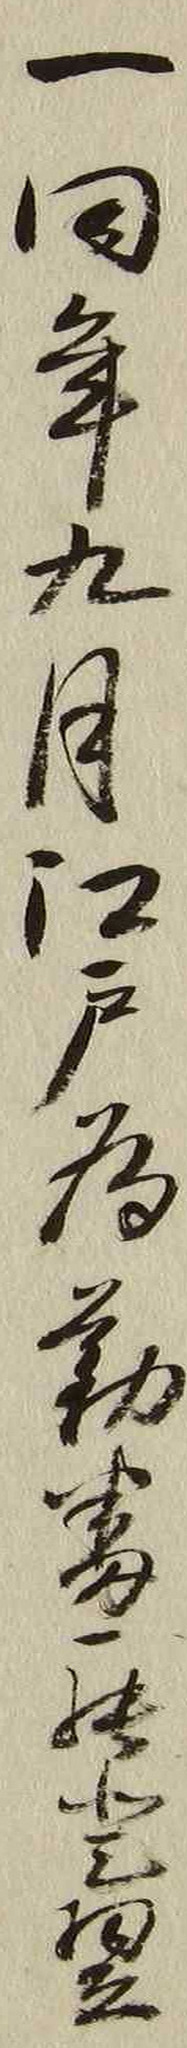一同年九月江戸為勤番罷登翌
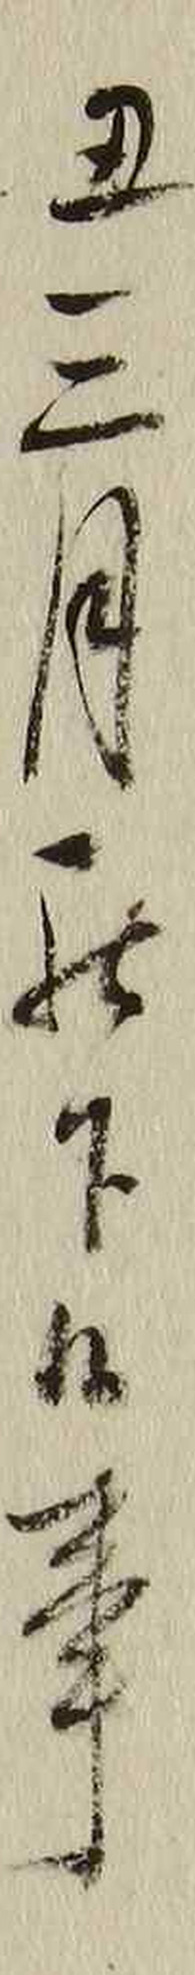丑三月罷下候事
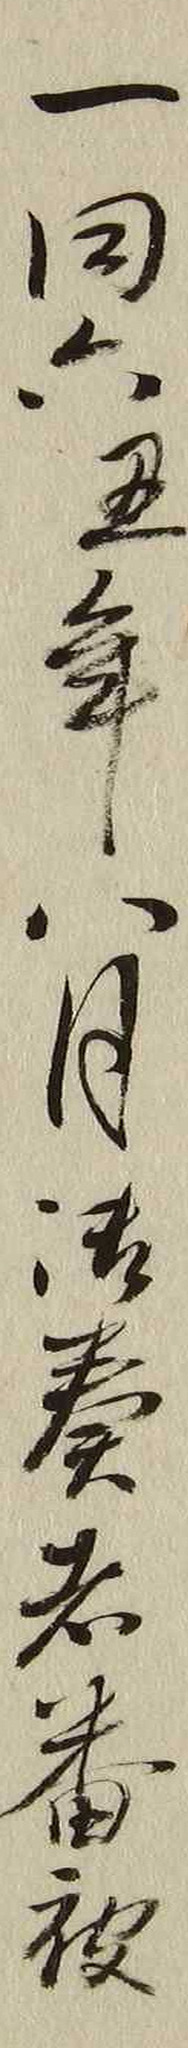一同六丑年八月御奏者番被
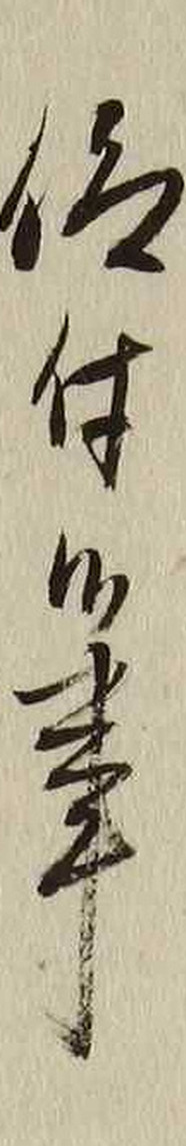仰付候事
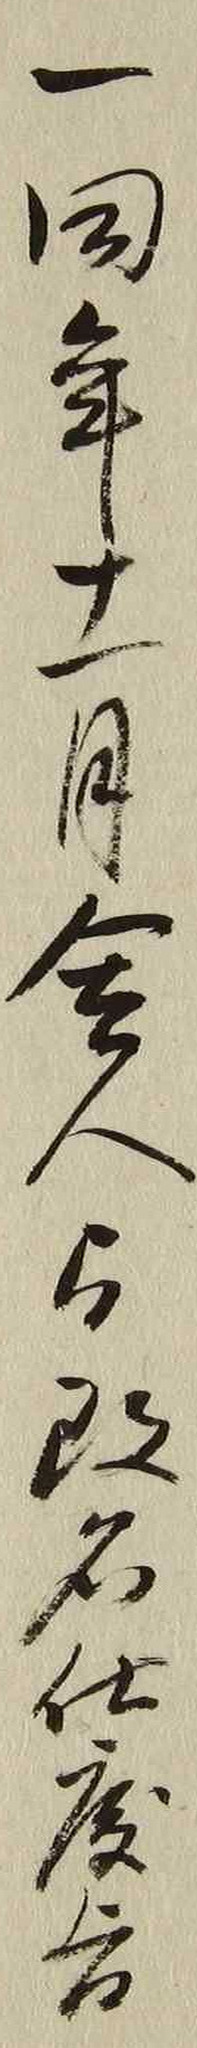一同年十一月舎人与改名仕度旨
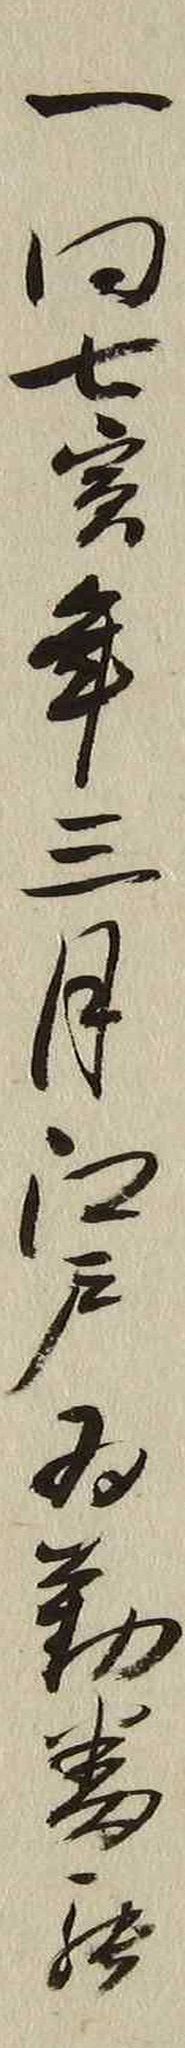一同七亥年三月江戸為勤番罷
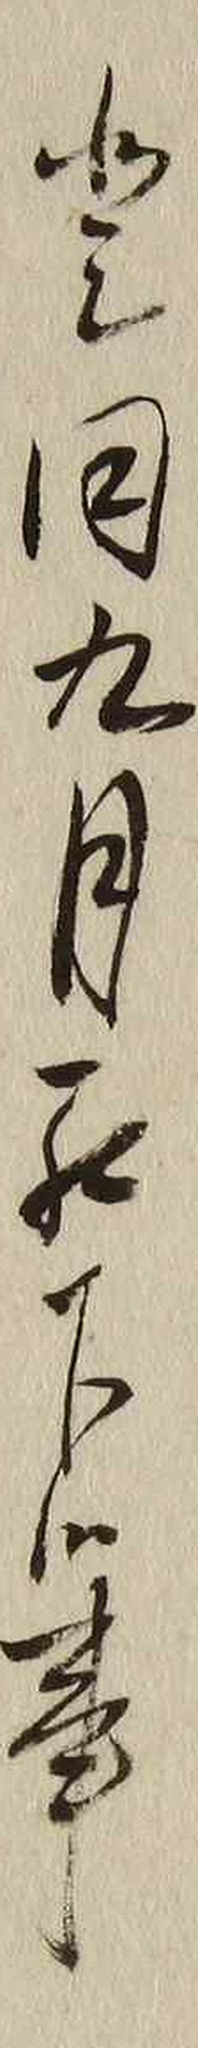登同九月罷下候事
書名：諸士系譜　巻之355　す之部5
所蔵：会津若松市立会津図書館
